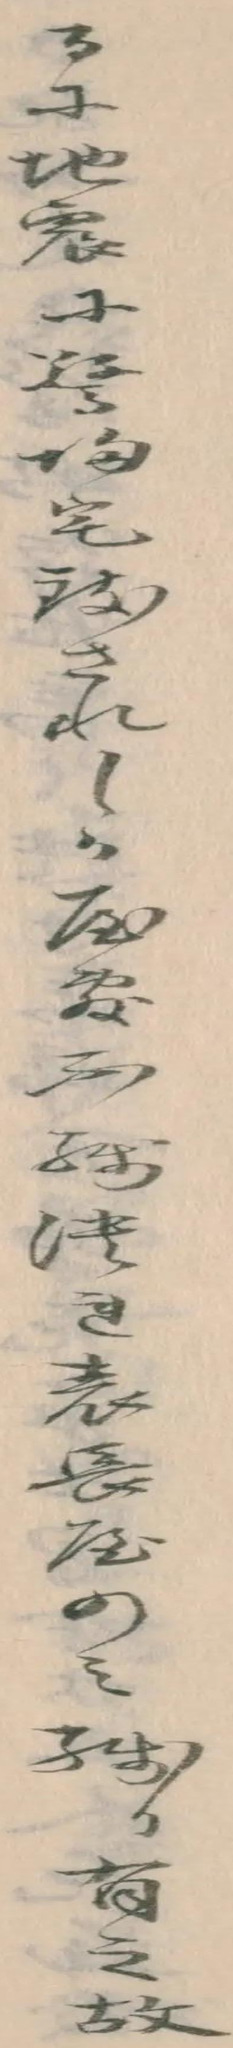るに地震に驚帰宅致されしか屋敷不残潰れ表長屋のみ残り有之故
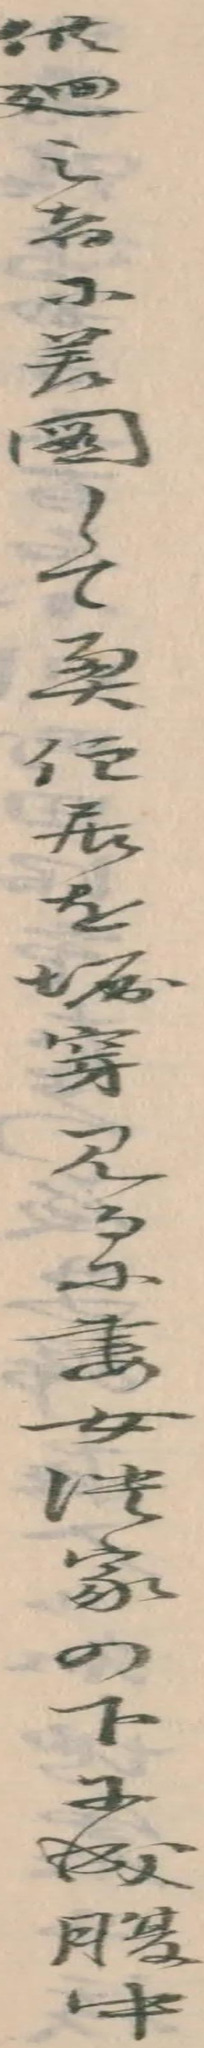供廻之者に差図して奥住居を掘穿見るに妻女潰家の下に成腹中
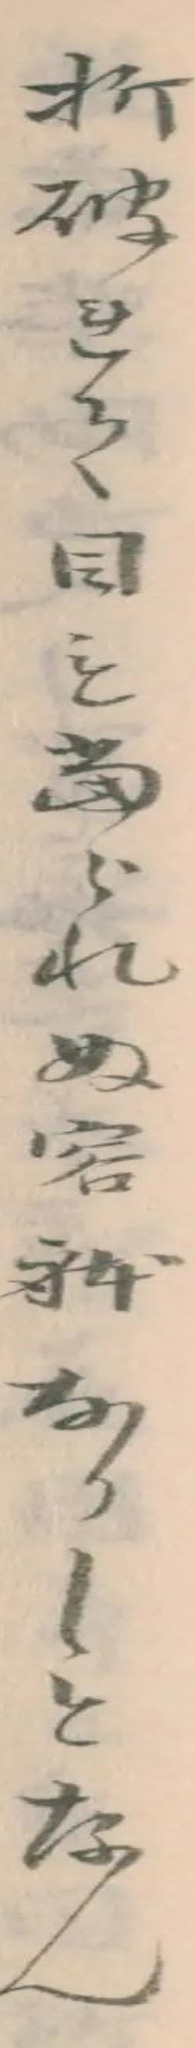折破れて目も当られぬ容躰なりしとなん
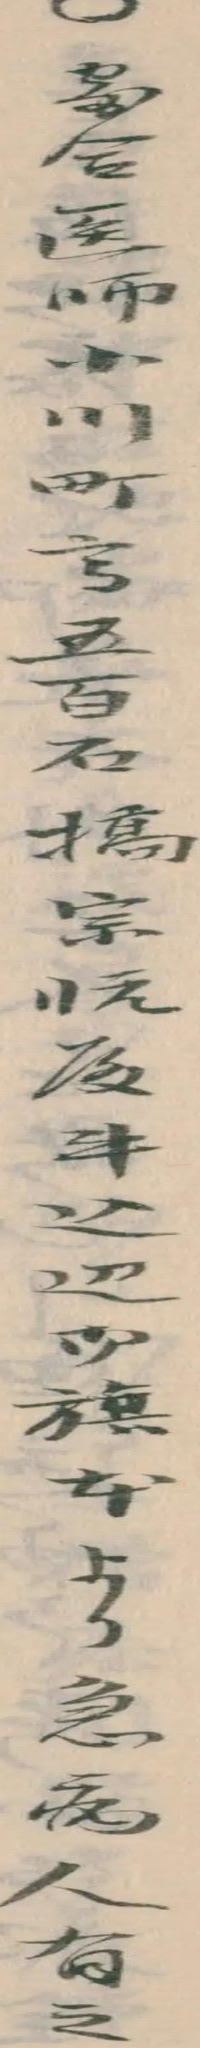〇寄合医師小川町高五百石塙宗悦殿牛込辺御旗本より急病人有之
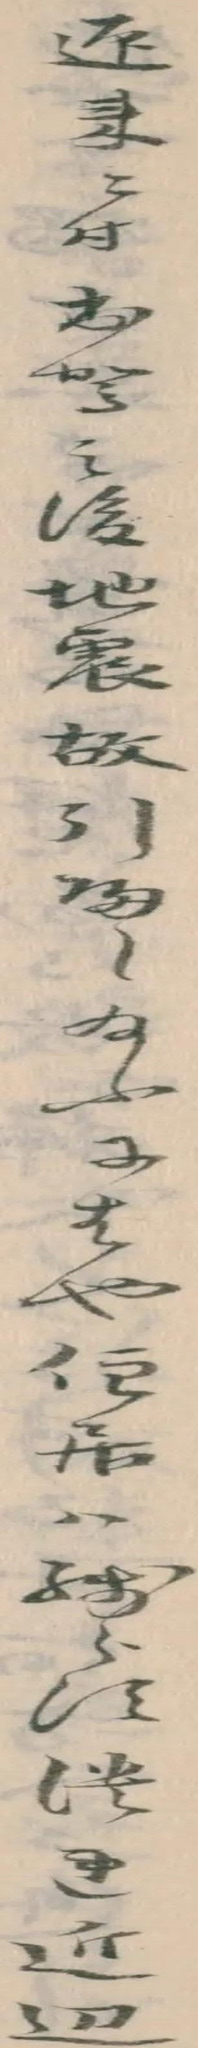迎来付出駕之後地震故引帰し給ふにはや住居は残らす潰れ近辺
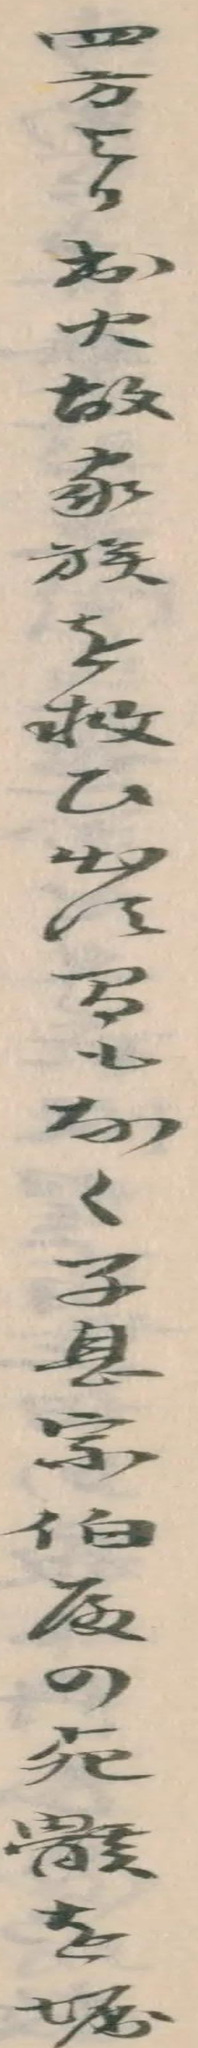四方より出火故家族を救ひ出す間もなく子息宗伯殿の死骸を掘
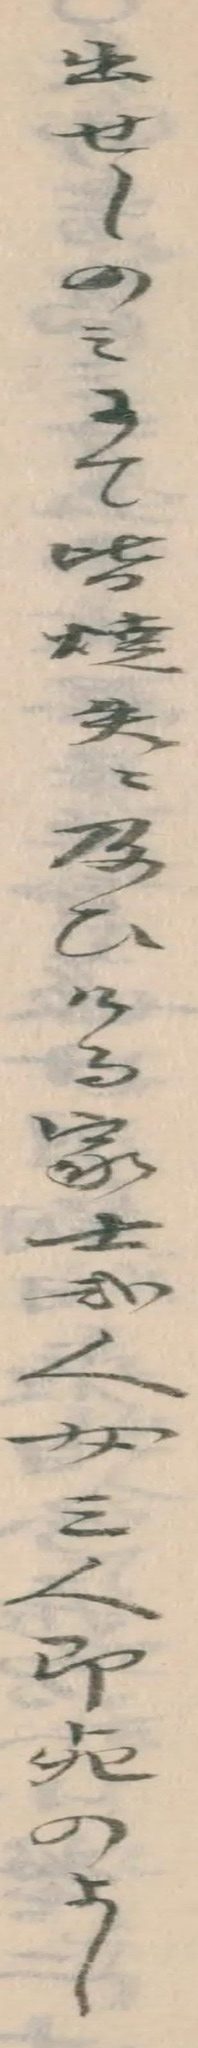出せしのみにて皆焼失に及ひける家士弐人女三人即死のよし
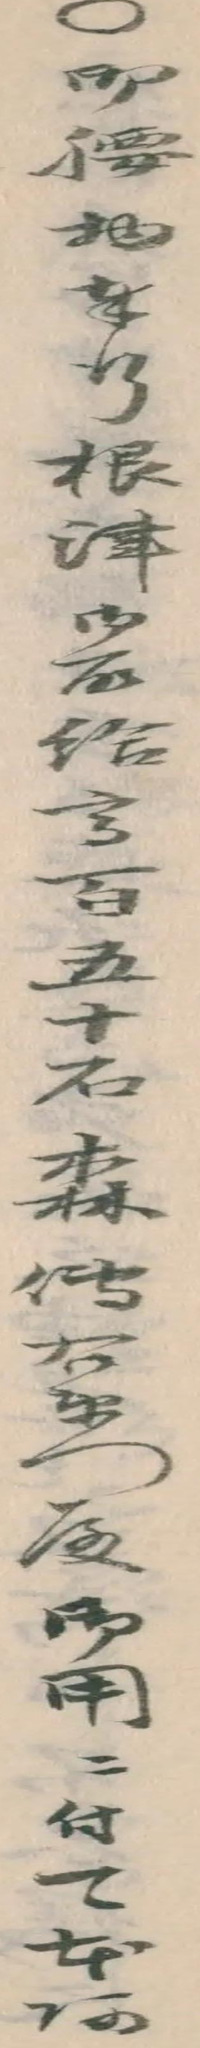〇御腰物奉行根津御取給高百五十石森伝右衛門殿御用に付て本阿
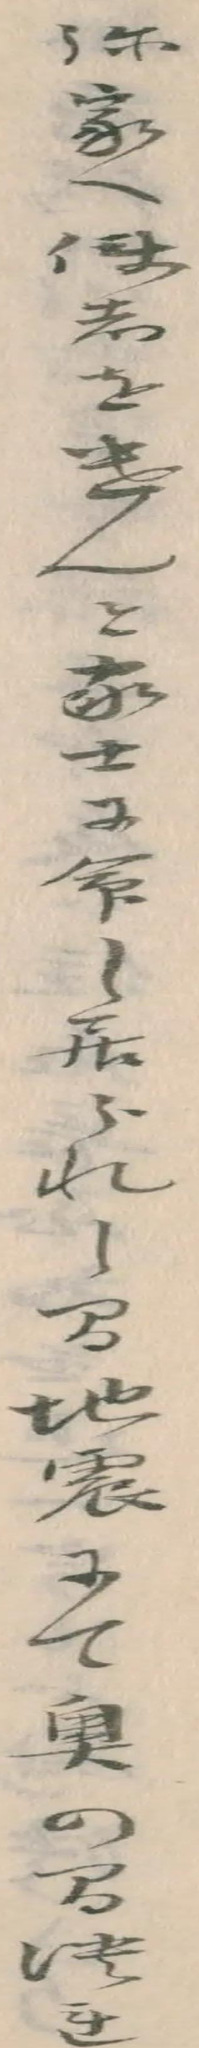弥家へ使者を遣んと家士に命し居られし間地震にて奥の間潰れ
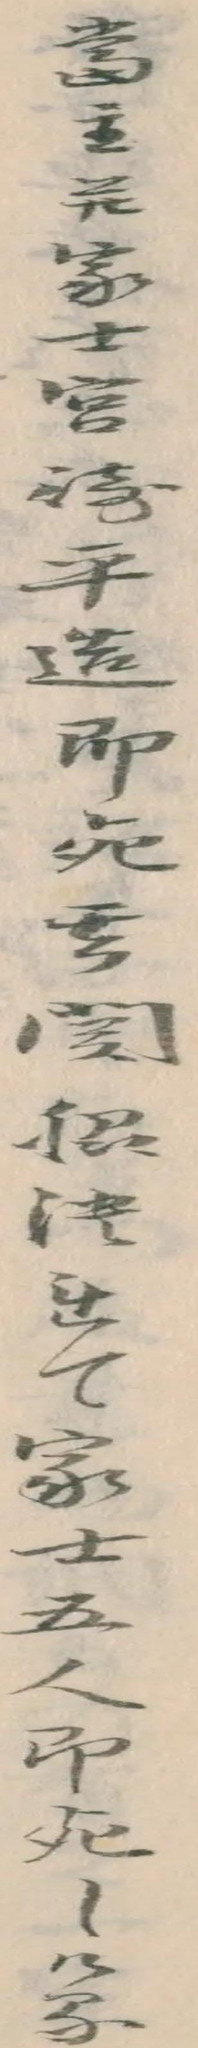当主并家士宮崎平造即死玄関脇潰れて家士五人即死しける
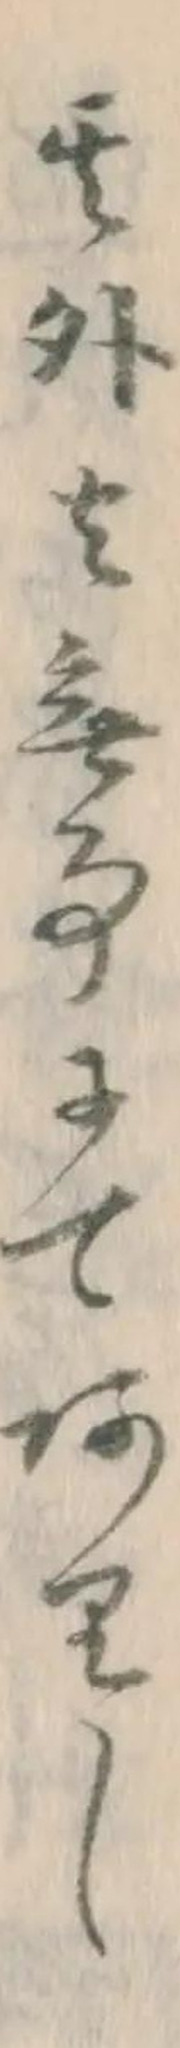其外は無事にてありし
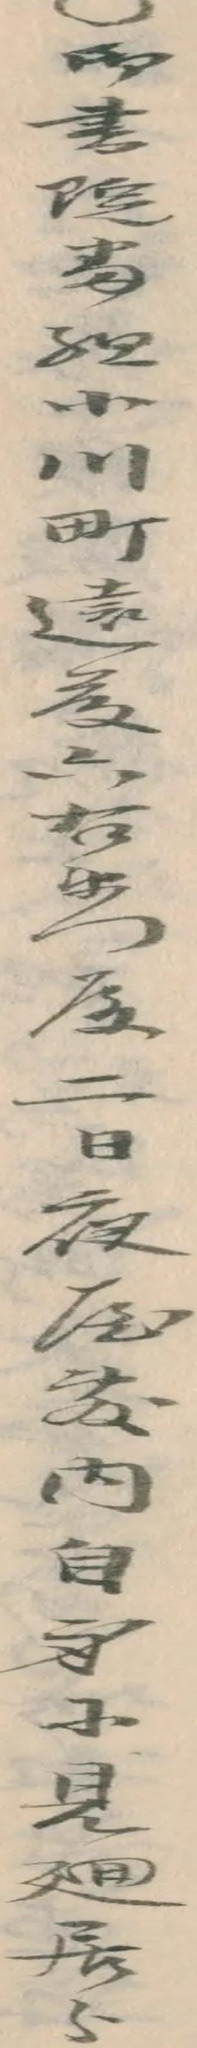〇御書院番組小川町遠藤六右衛門殿二日夜屋敷内自身に見廻居ら

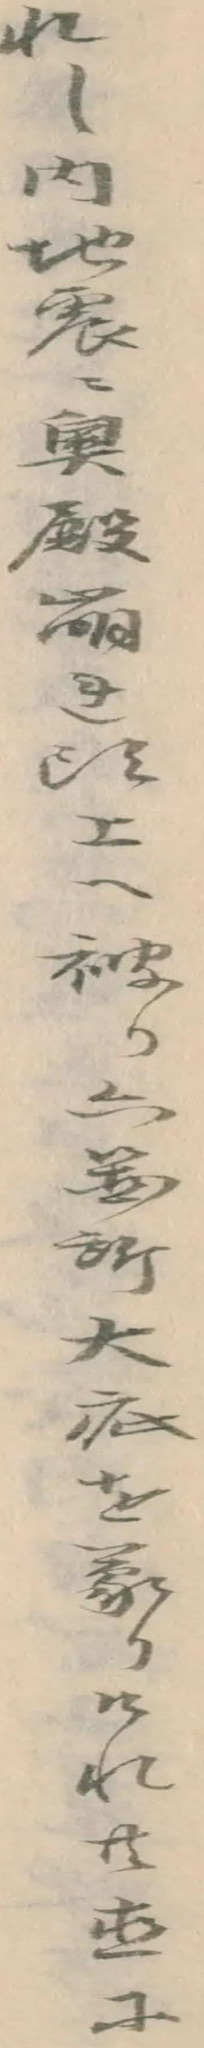れし内地震に奥殿崩れ頭上へ被り六箇所大疵を蒙りけれ共直に
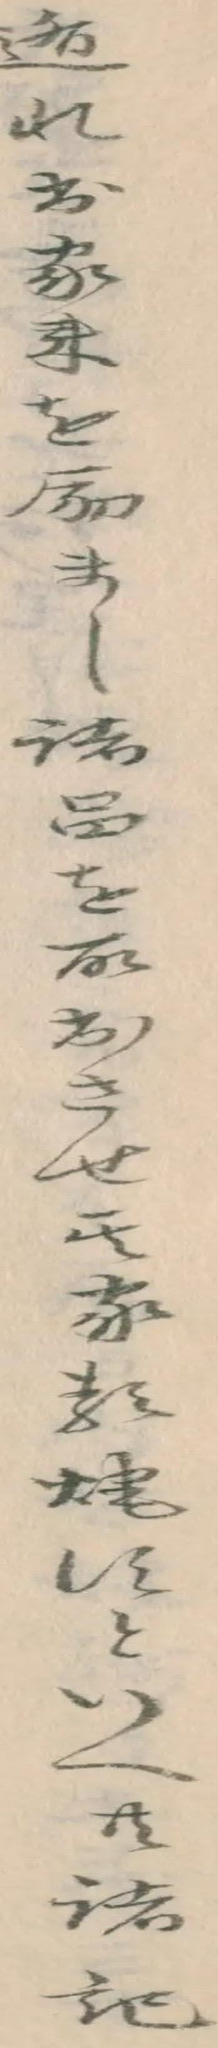遁れ出家来を励まし諸品を取出させ其家類焼すといへ共諸記
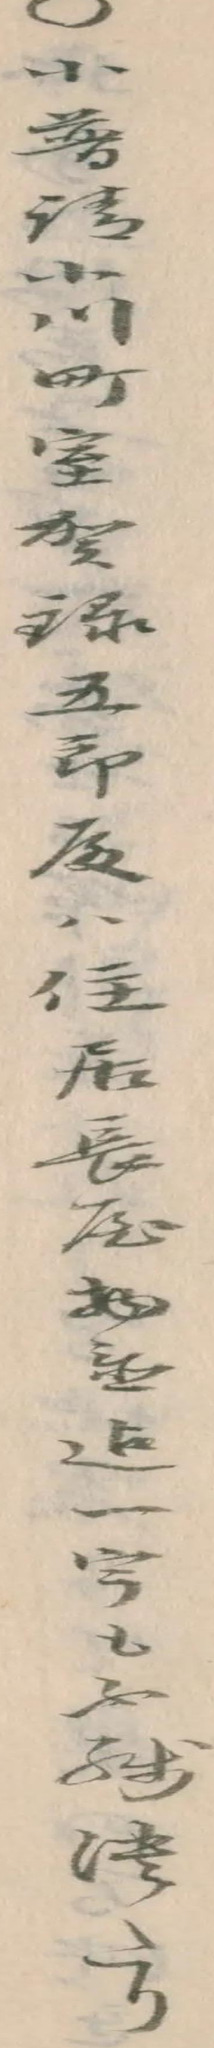〇小普請小川町室賀録五郎殿は住居長屋物置迄一宇も不残潰たり
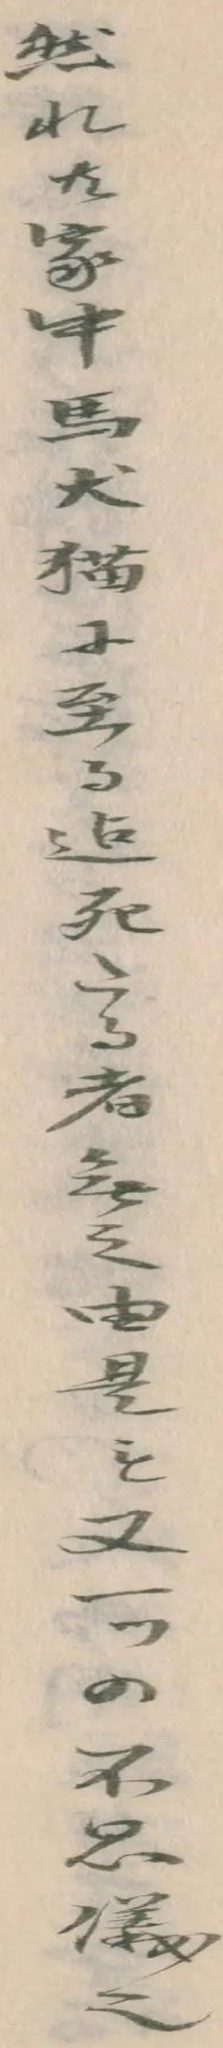然れ共家中馬犬猫に至る迄死たる者無之由是も又一ツの不思儀也
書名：地災撮要. 巻10(地震之部) 上,下
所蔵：国立国会図書館 National Diet Library, JAPAN
